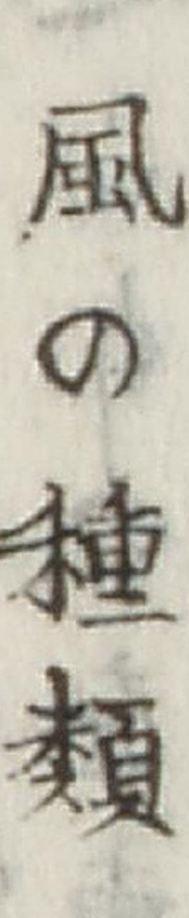風の種類
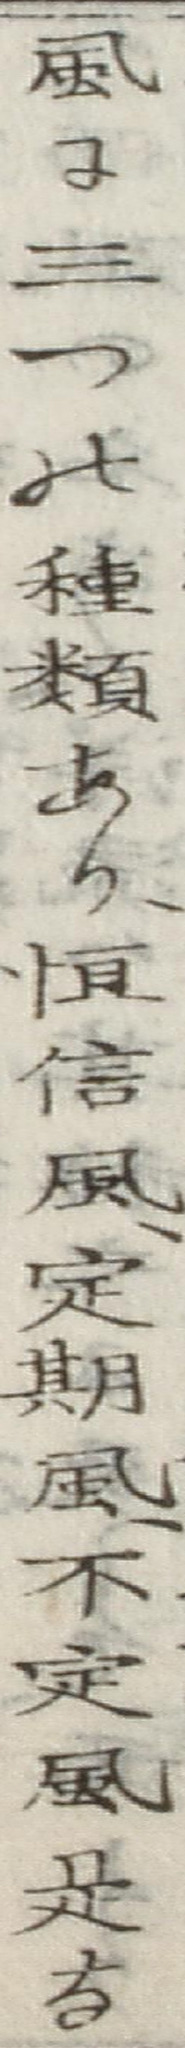風に三つの種類あり、恒信風、定期風、不定風是な
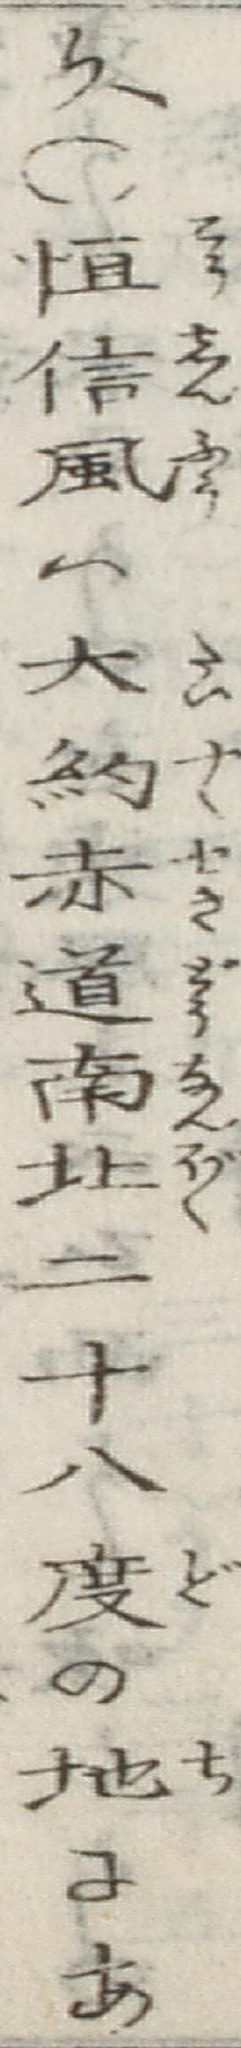り、〇恒信風は大約赤道南北二十八度の地にあ
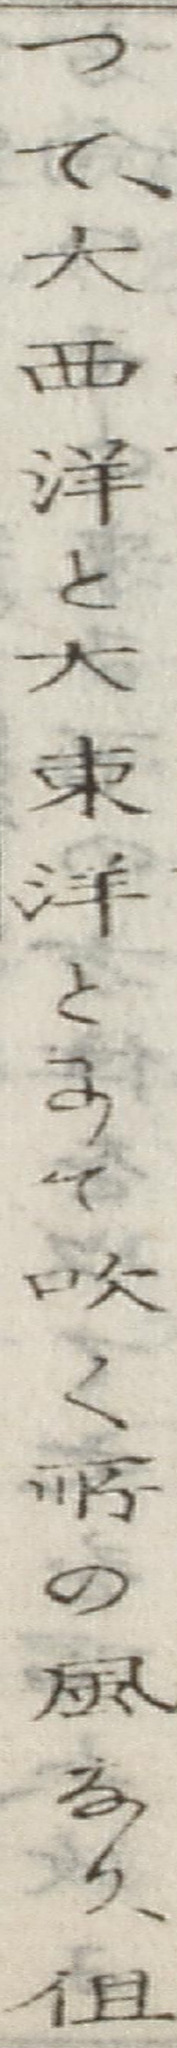つて、大西洋と大東洋とにて吹く所の風なり、但
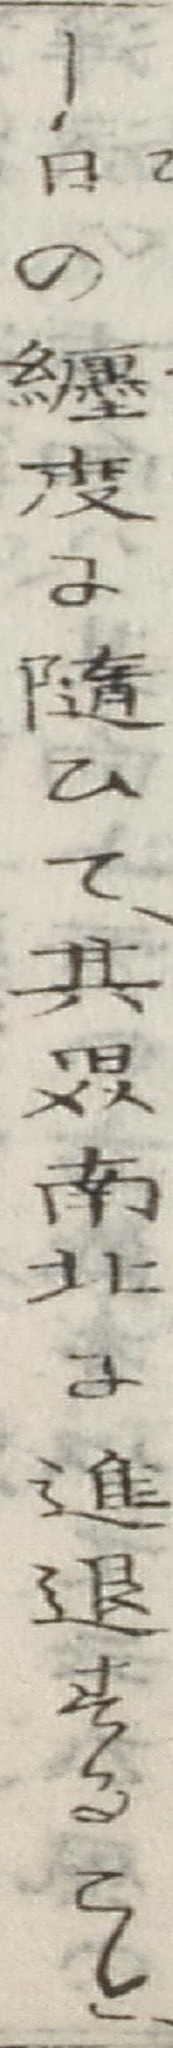し日の纏度に随ひて、其界南北に進退すること、
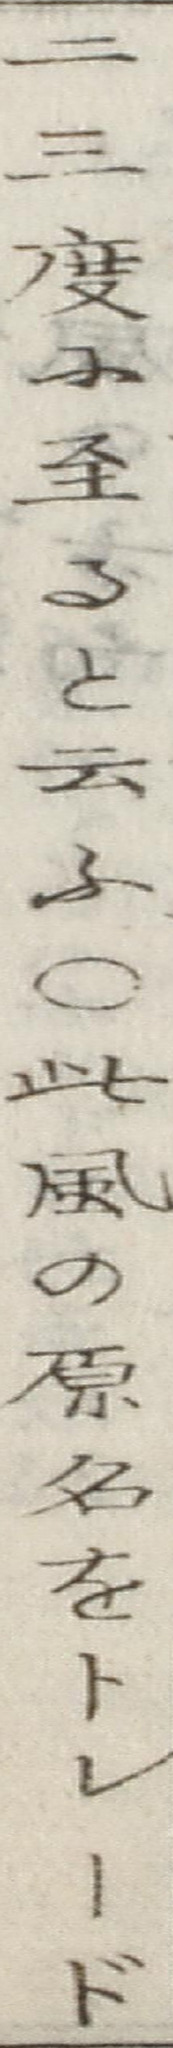二三度に至ると云ふ、〇此風の原名をトレード
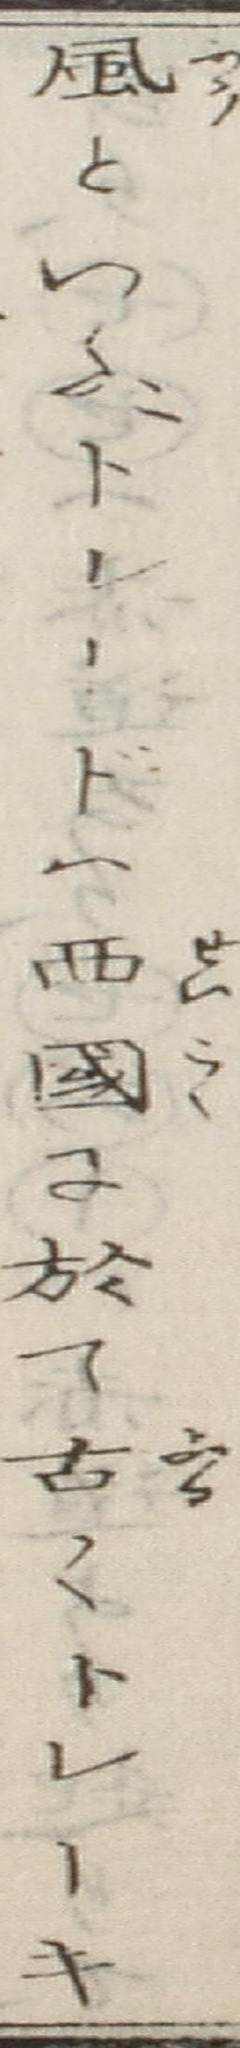風といふ、トレードは西国に於て古くトレーキ
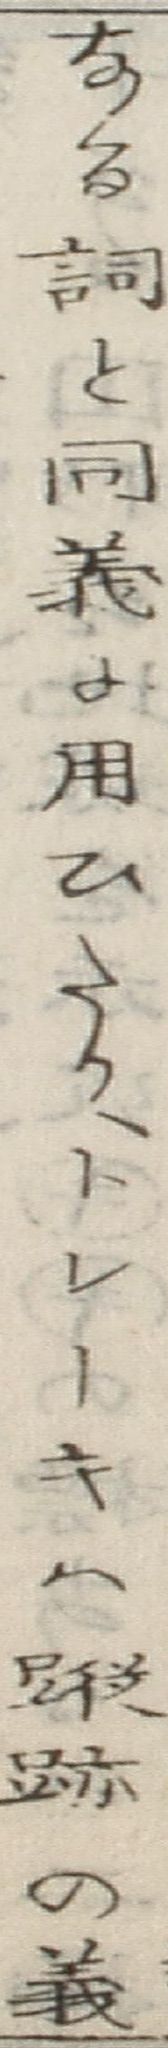なる詞と同義に用ひたり、トレーキは蹤跡の義
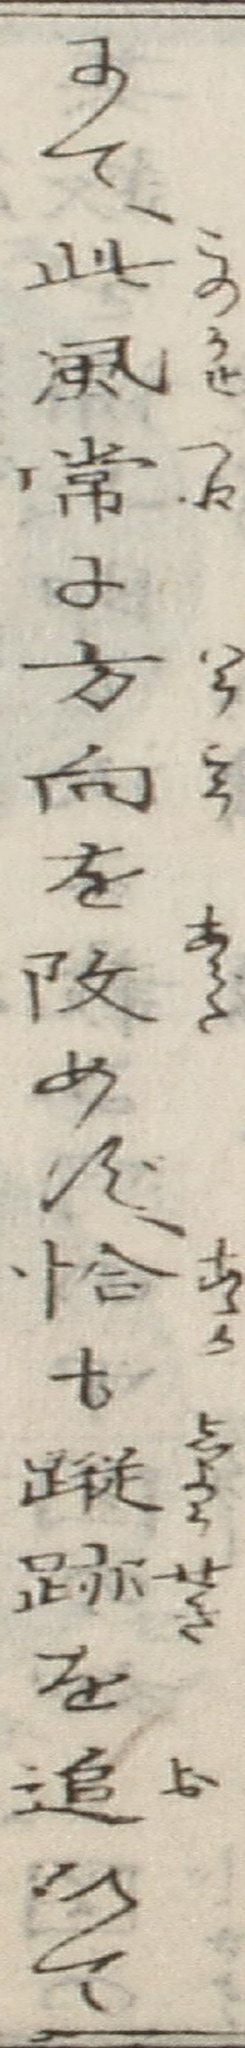にて、此風常に方向を改めず、恰も蹤跡を追ひて
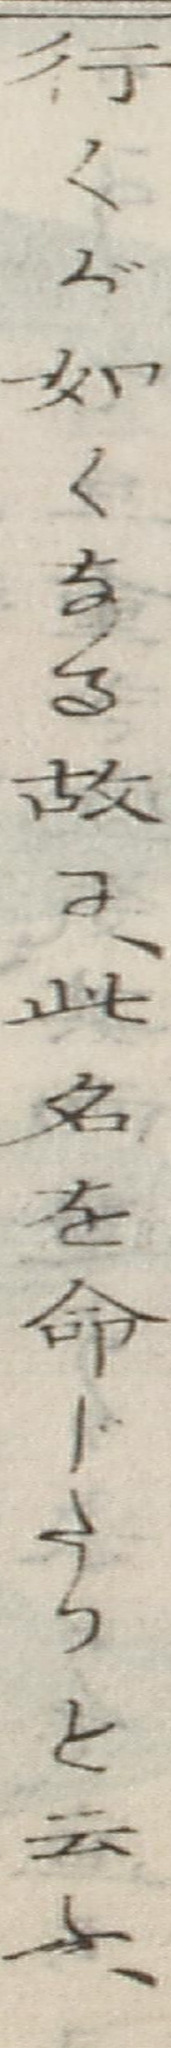行くが如くなる故に、此名を命じたりと云ふ、
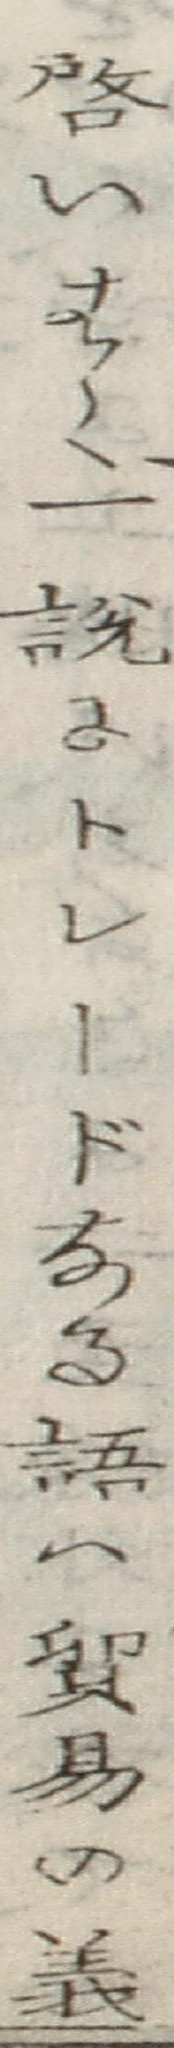啓いはく、一説にトレードなる語は貿易の義
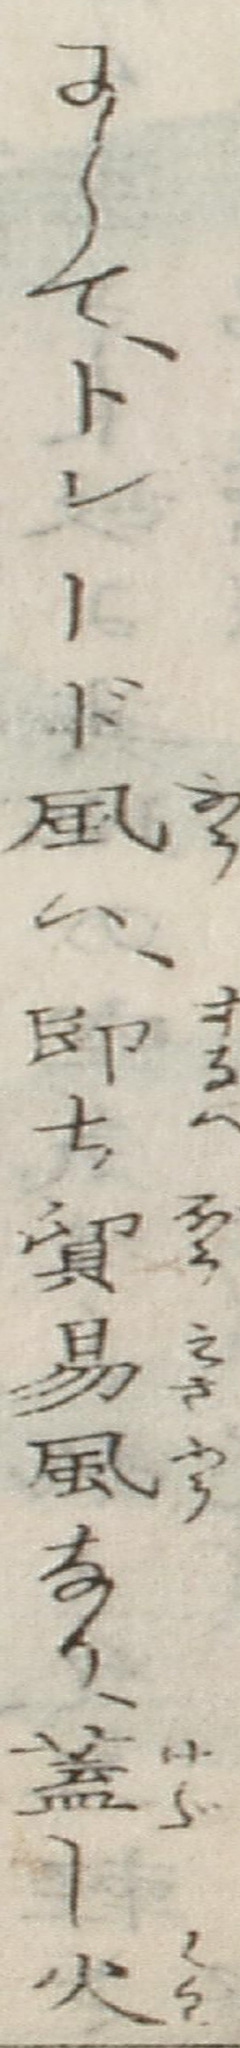にして、トレード風は、即ち貿易風なり、蓋し火
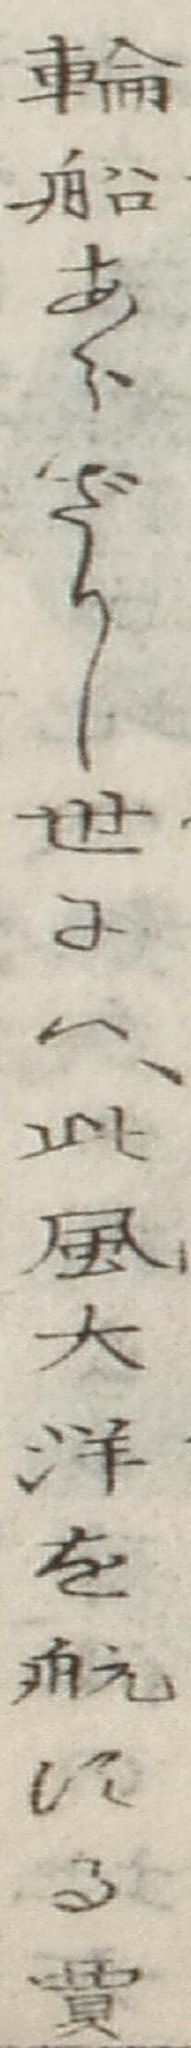輪船あらざりし世には、此風大洋を航する賈
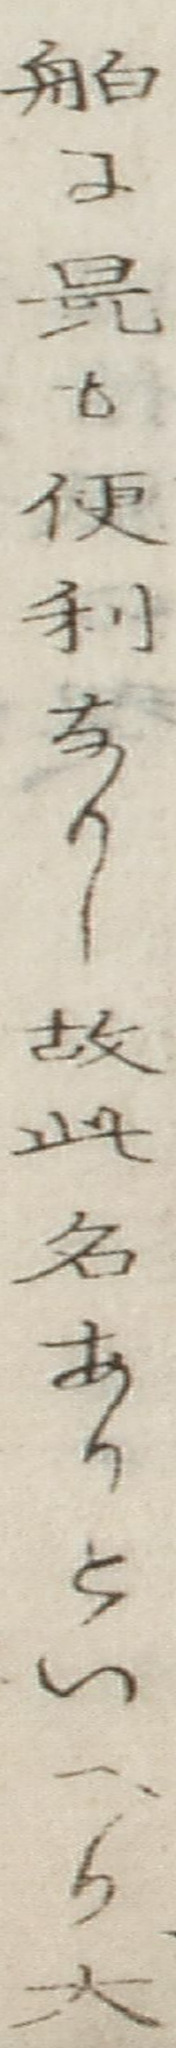舶に最も便利なりし故此名ありといへり、大
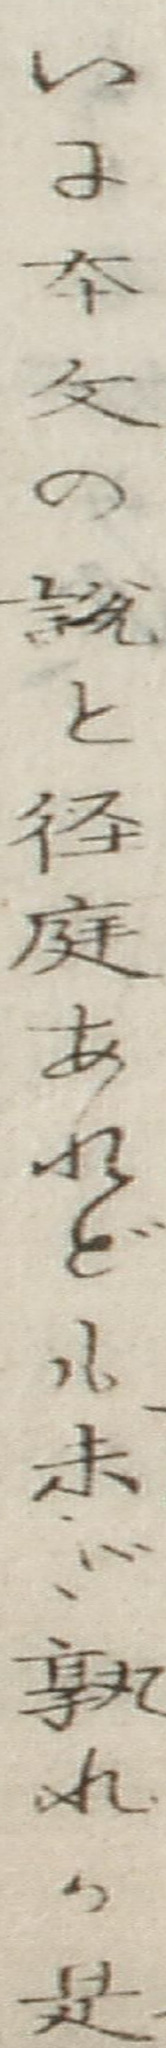いに本文の説と径庭あれども、未だ孰れか是

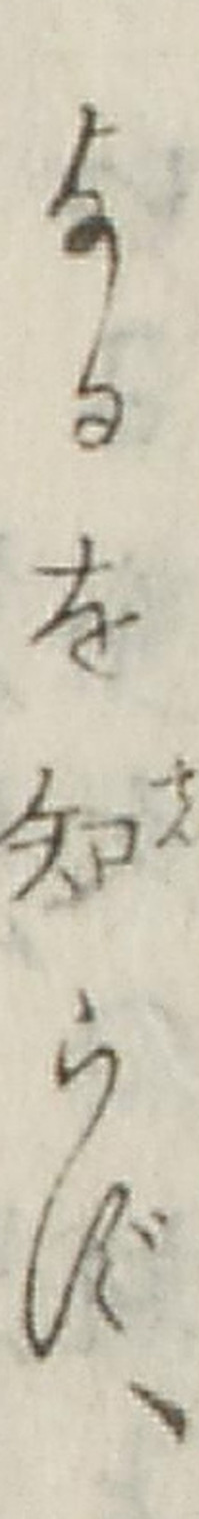なるを知らず、
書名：訓蒙　天然地理學　中
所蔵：東京大学地震研究所図書室 Earthquake Research Institute Library, The University of Tokyo, JAPAN
